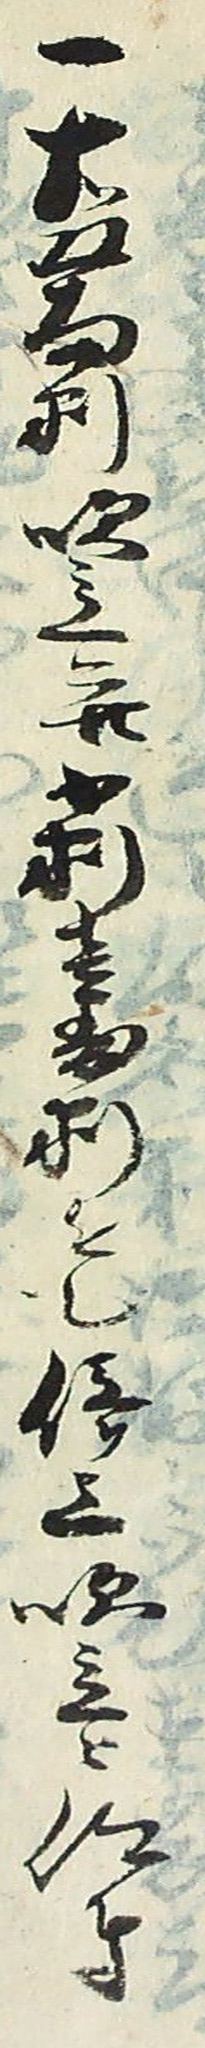一右五両判吹立幷小判壱歩判をも位を上吹立被仰付
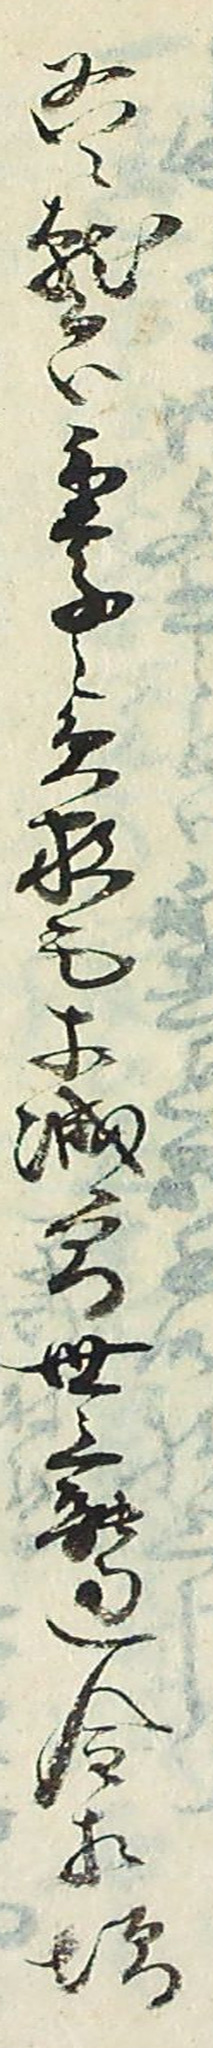右に就ては金子之員数も相減候間世上融通金相増
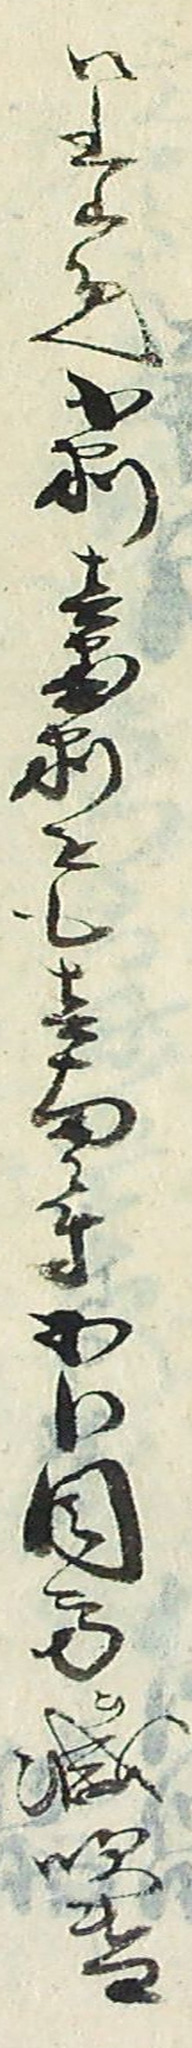候ため小判壱歩判をも壱両に付五分目方を減吹替
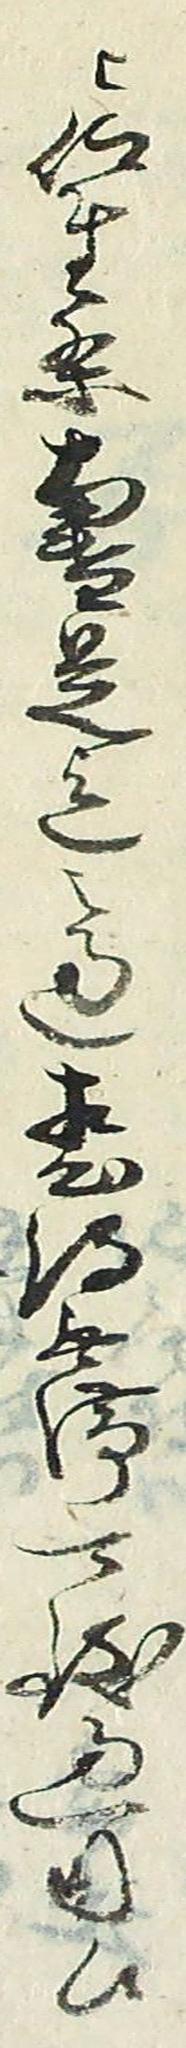被仰付候条両替是迄之通相心得無滞可致通用候
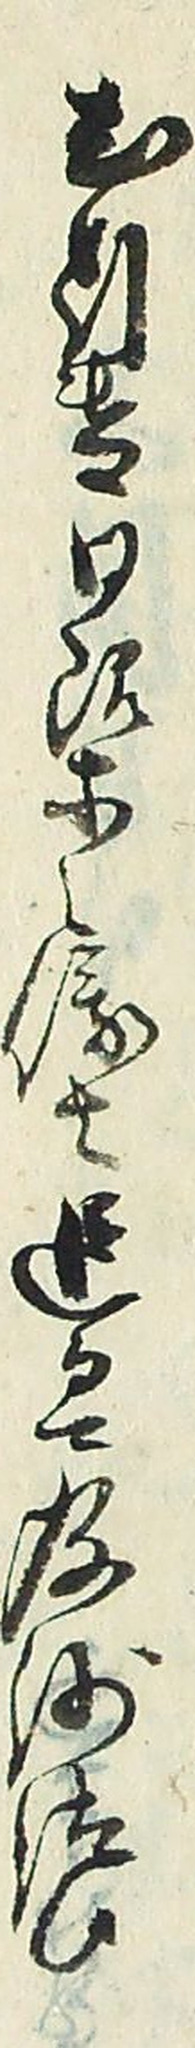尤引替日限等之儀は追而可及沙汰候
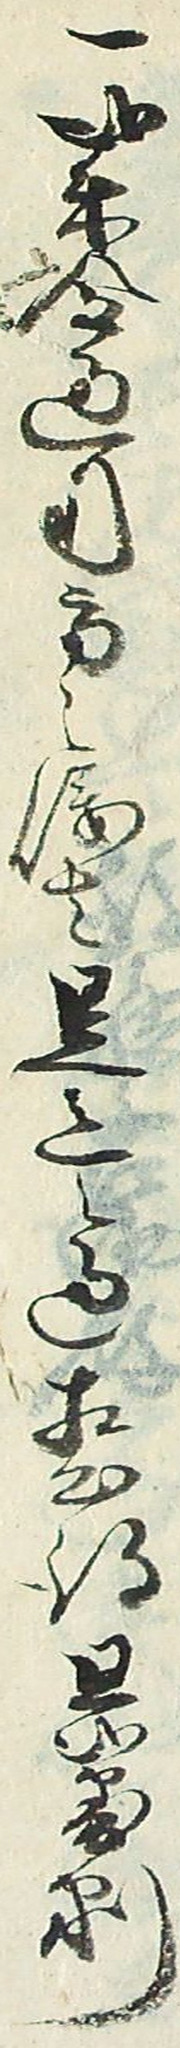一弐朱金通用方之儀は是迄之通相心得且弐歩判
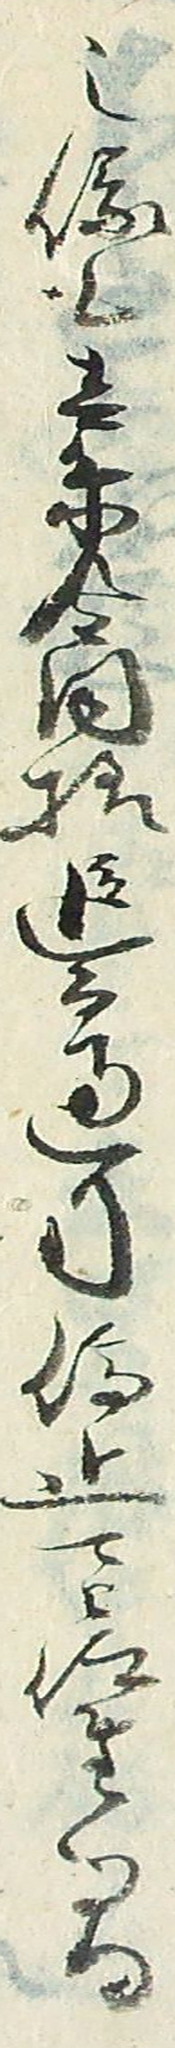之儀も壱朱金同様追而通用停止可被仰付候間
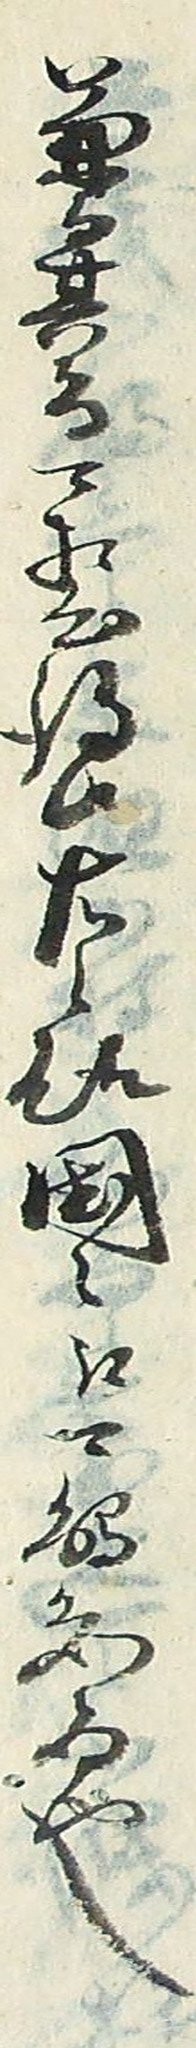兼而其旨可相心得候右之趣国々江可触知者也

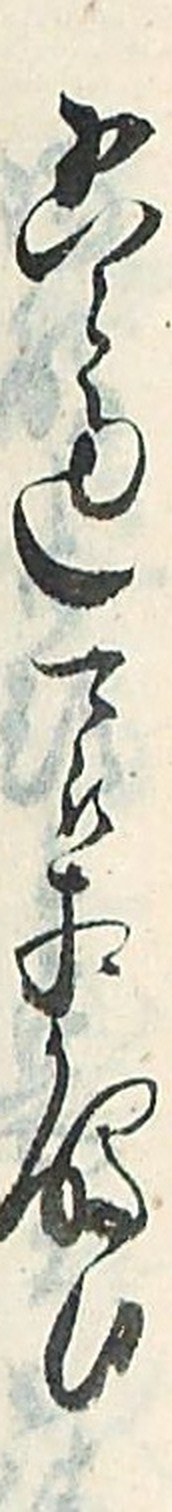右之通可被相触候
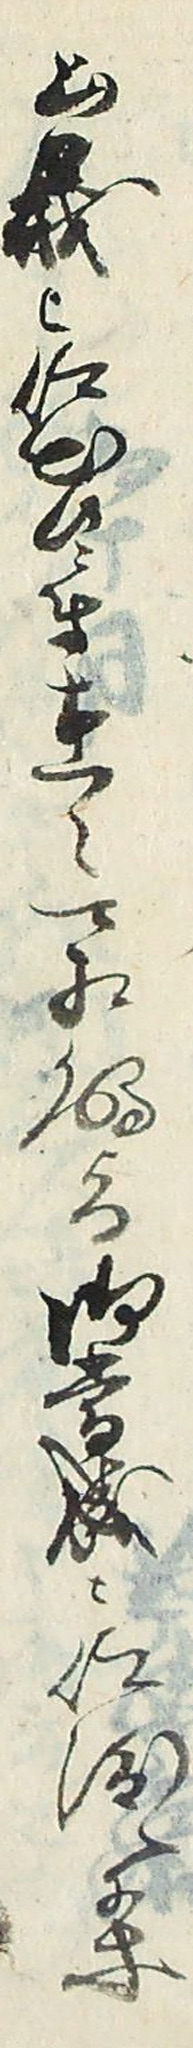公義被仰出候候に付在々可相触旨御当職被仰渡候条
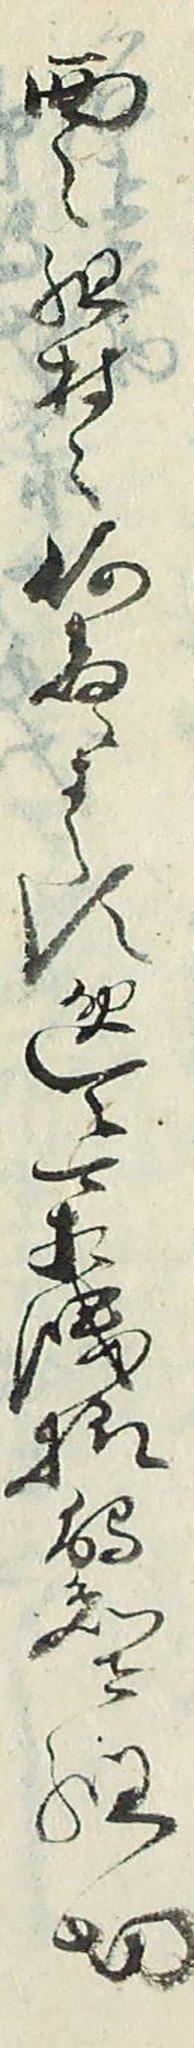面々組村々何者によらす逸々可相洩様触知せ組切
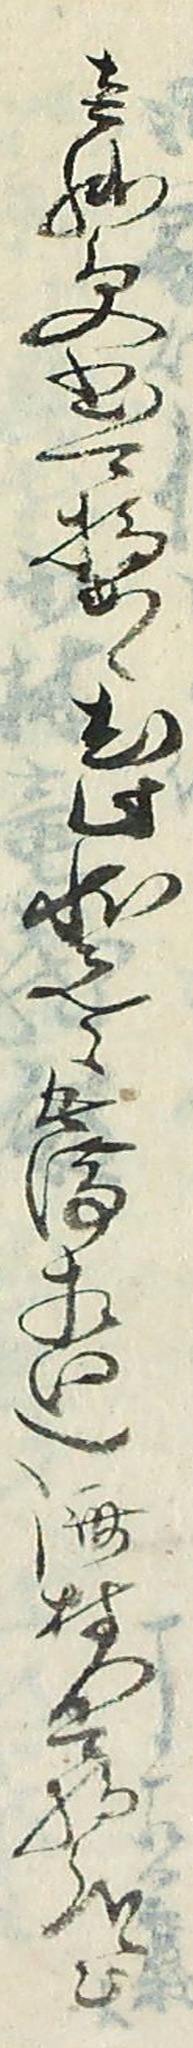壱紙受書可指出候尤此状先々無滞相廻済村ゟ可指戻候以上
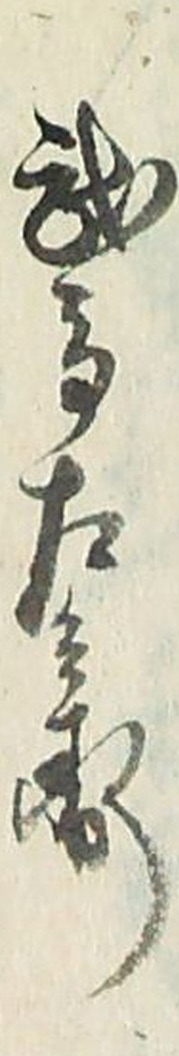武市左兵衛
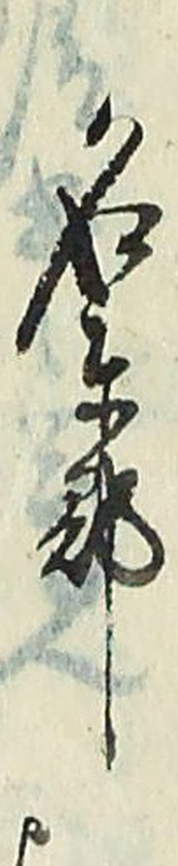名東郡
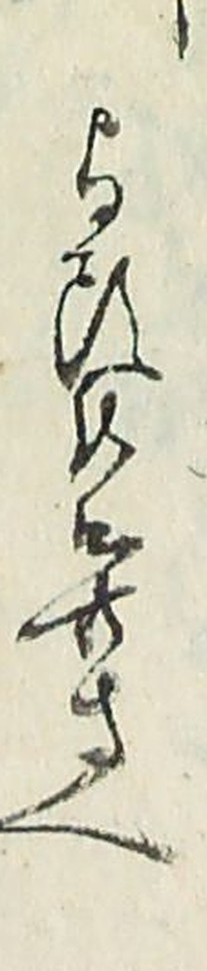与頭庄屋共方へ
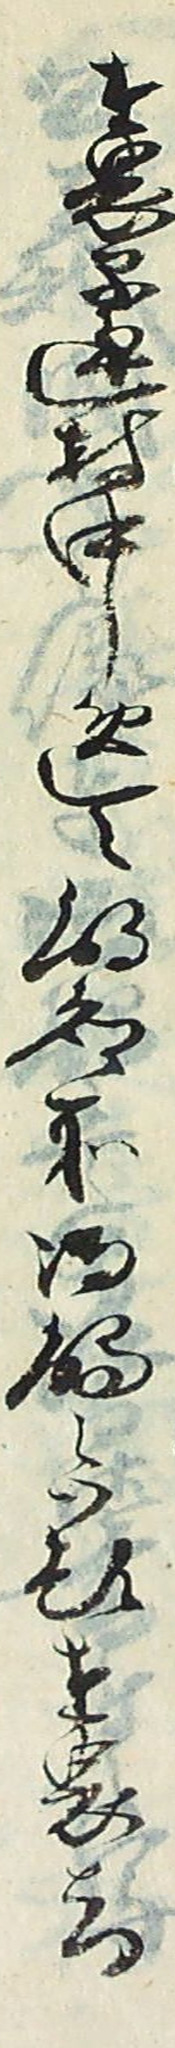奉畏早速村中逸々触知候所御触之御趣奉畏旨
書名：諸御用御□受書控
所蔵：鳴門教育大学 Naruto University of Education
